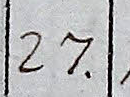27.
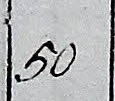50
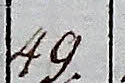49.
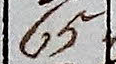65
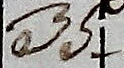35
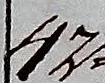42
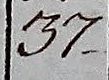37
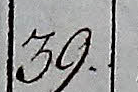39.
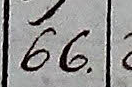66.
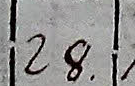28.
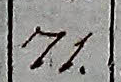71.
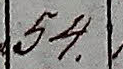54.
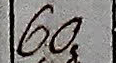60.
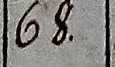68.
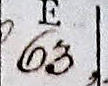63
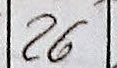26
